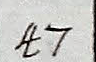47
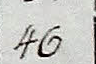46
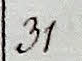31
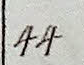44
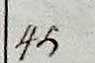45
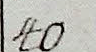40
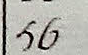56
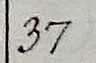37
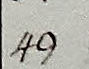49
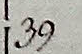39
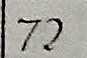72
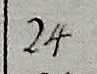24
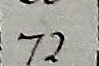72
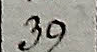39
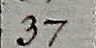37
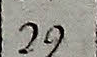29
